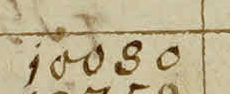10080
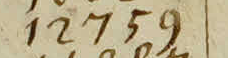12759
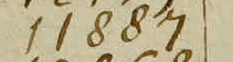11887
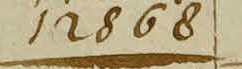12868
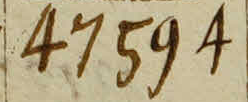47594
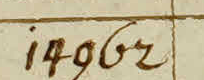14962
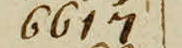6617
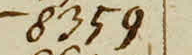8359
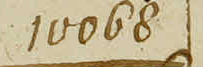10068
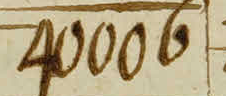40006
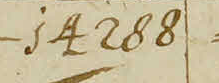14288
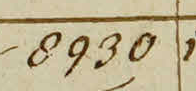8930
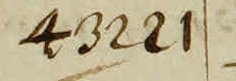43221
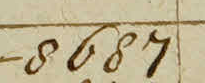8687
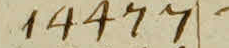14477
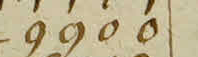9900
